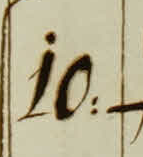10:
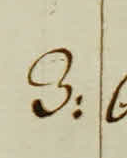3:
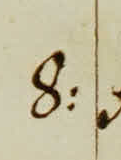8:
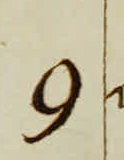9
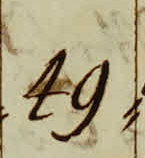49
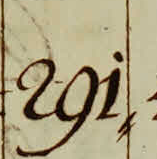291
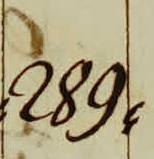289
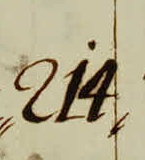214
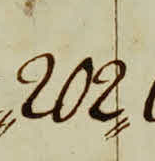202
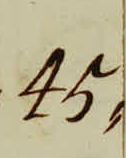45
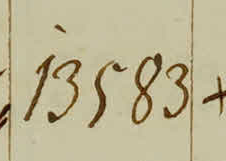13583
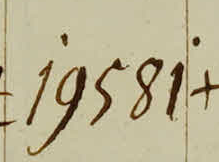19581
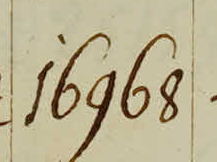16968
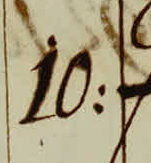10:
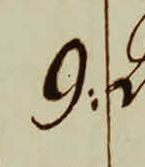9:
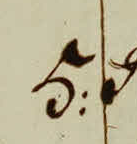5:
